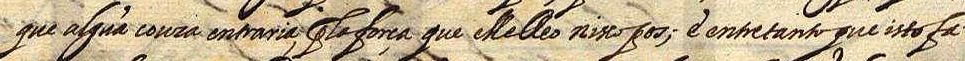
que alguā couza entraria, p̄la força que elle Reo nisso pos; e entretanto que isto fa
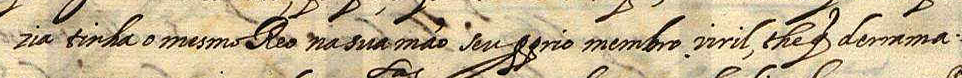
zia tinha o mesmo Reo na sua mão seu ꝓprio membro viril, the q̄ derrama
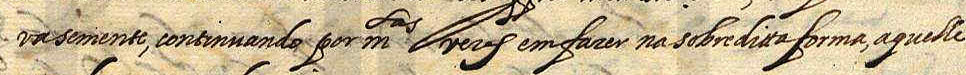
va semente, continuando por mtas vezes em fazer na sobreditta forma, aquelle
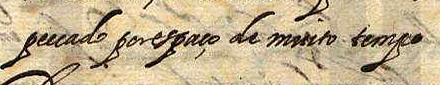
peccado por espaço de muito tempo
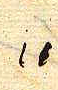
11
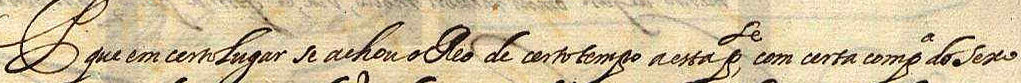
P que em certo Lugar se achou o Reo de certo tempo a esta pte, com certa compa do sexo
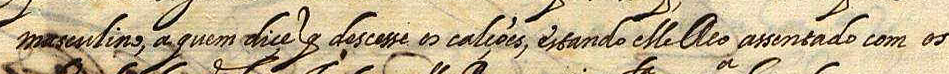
masculino, a quem dice q̄ descesse os calções, estando elle Reo assentado com os
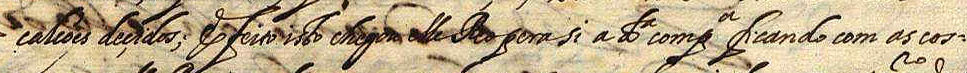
calçoes decidos, & feito isto chegou elle Reo pera si a d̄a compa ficando com as cos
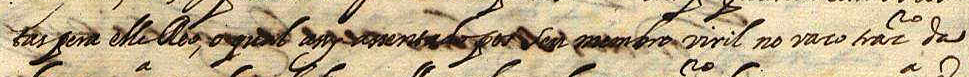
tas pera elle Reo, o qual assy assentado pos seu membro viril no vazo trazro da
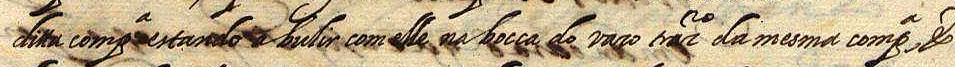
ditta compa estando a bulir com elle na bocca do vazo trazro da mesma compa, &
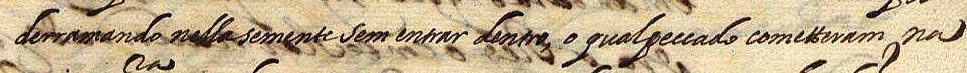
derramando nella semente sem entrar dentro, o qual peccado cometteram, na
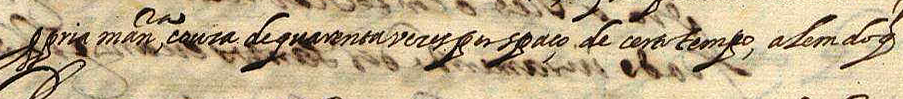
ꝓpria manra, couza de quarenta vezes por spaço de certo tempo, alem do q̄
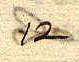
12
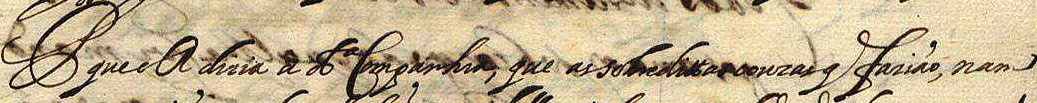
P que o R dizia a d̄a Companhia, que as sobredittas couzas q̄ faziaõ, nam
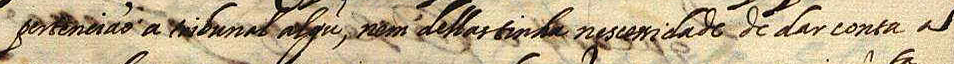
pertenciaõ a tribunal algū, nem dellas tinha nescessidade de dar conta a
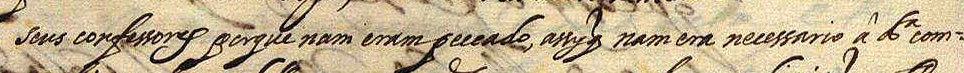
seus confessores porque nam eram peccado, assy q̄ nam era necessario a d̄a com
